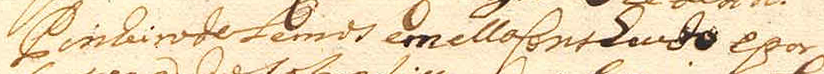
Pinheiro de Lemos em ella Contheudo e por
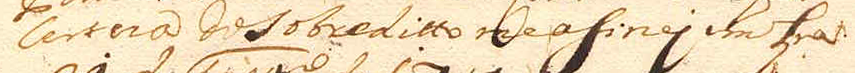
certeza do sobreditto me asinej em Lra
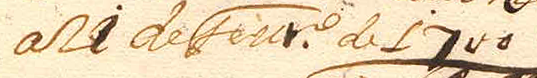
a 2i de Feur.o de i700
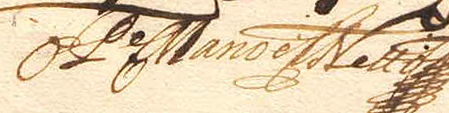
O Pe Manoel Netto
